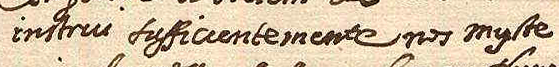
instrui sufficientemente nos miste
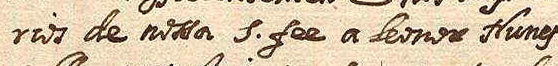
rios de nossa s. fee a Leonor Nunes
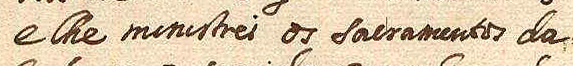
e lhe ministrei os sacramentos da
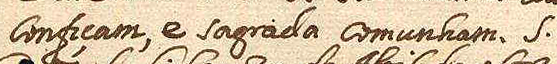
confiçam, e sagrada comunham. S.
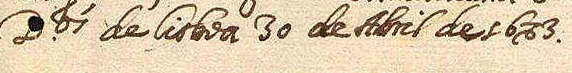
D.os de lisboa 30 de Abril de 1683.
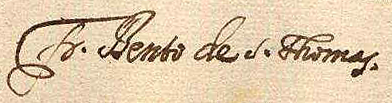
Fr. Bento de s. Thomas.
